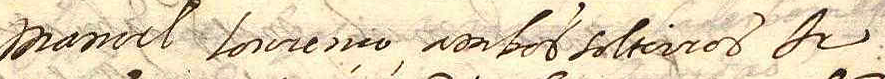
Manoel Lourenço, ambos solteiros Ir
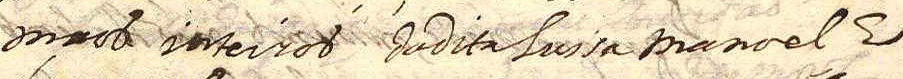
maos inteiros da dita Luisa manoel E
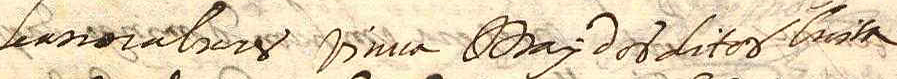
leanor alures Viuua May dos ditos luisa
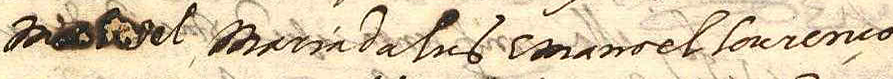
M___el, Maria da lus E manoel lourenço
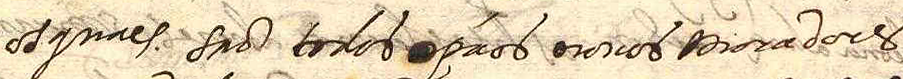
os quaes saõ todos _pãos nouos moradores
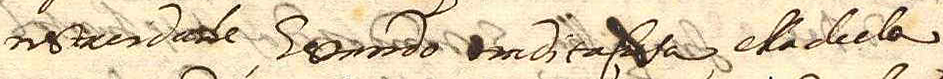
nesta erdade, E estando _m dita Casa, ella decla
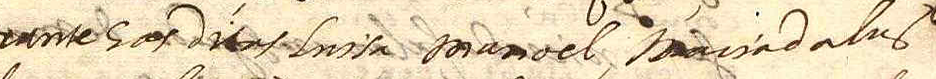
rante E as ditas luisa manoel, Maria da lus
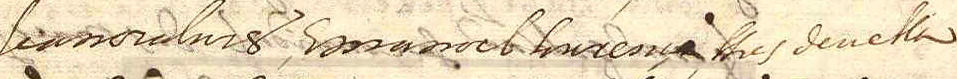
leanor alurs̄, E manoel lourenço, lhes deu ella
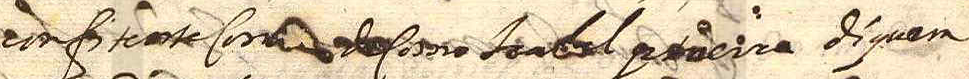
confitente Con__ de Como Iza_el p_reira dí quem
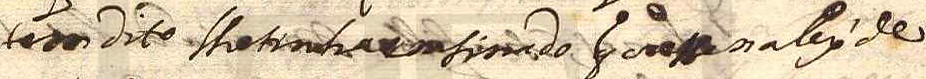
tem dito lhe tinha emsinado q̄ cresse na ley de
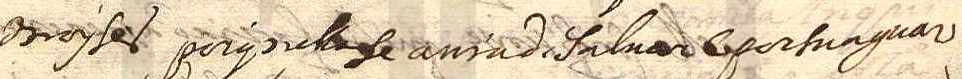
moyses porq̄ nella se auia de Saluar E por sua guar
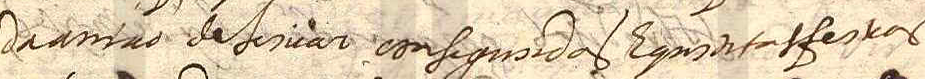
da auiaõ de Jeiuar em segundas E quintas feiras
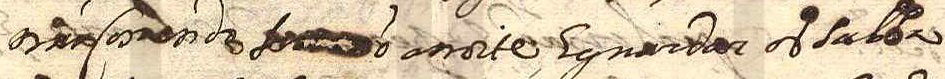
naõ Comendo s__õ a noite, E guardar os sabba
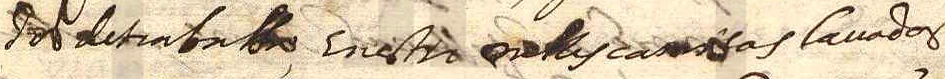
dos de trabalho, E uestir nelles camisas lauadas
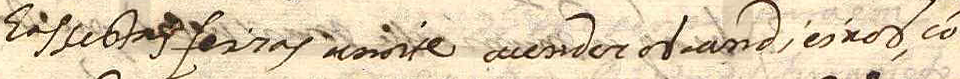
E as sestas feiras a noite acender os candieiros, cō
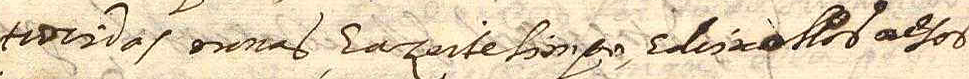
trocidas nouas, E azeite limpo, E deixallas acesas
